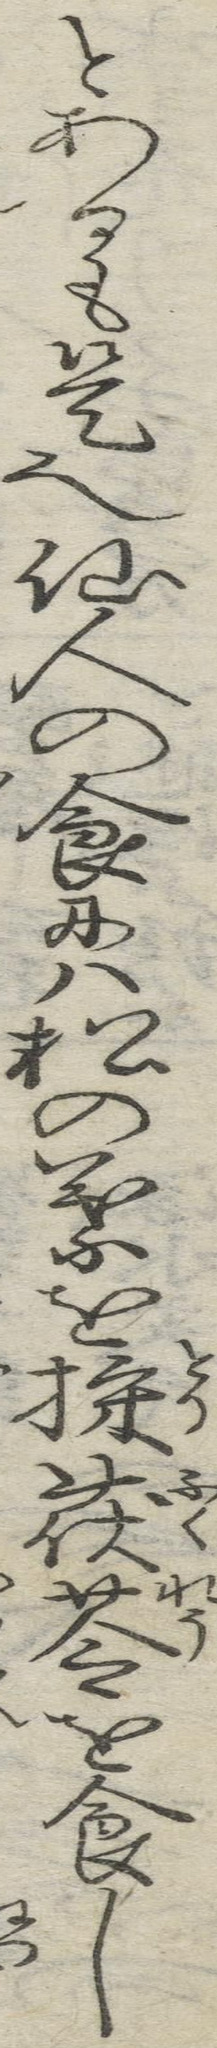とあるも是也仙人の食には松の葉を採茯苓を食し
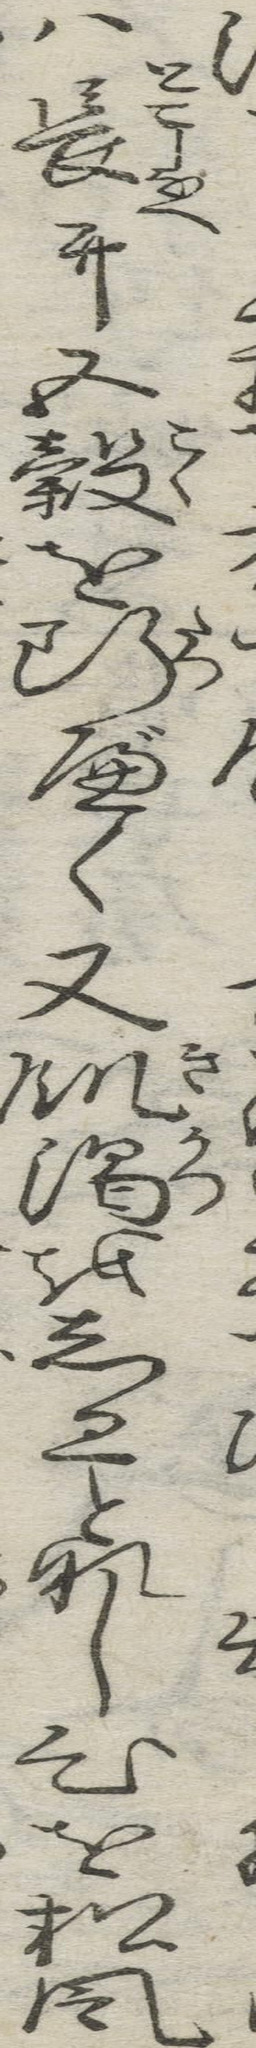は長に五穀を断べし又飢渇をしることなし心を松風
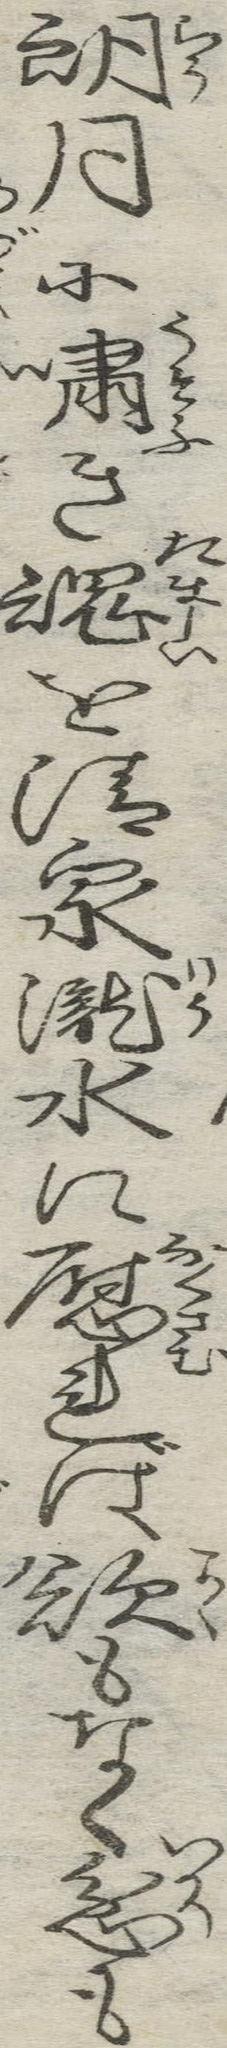朗月に嘯き魂を清泉瀧水に慰れば欲もなく忿も
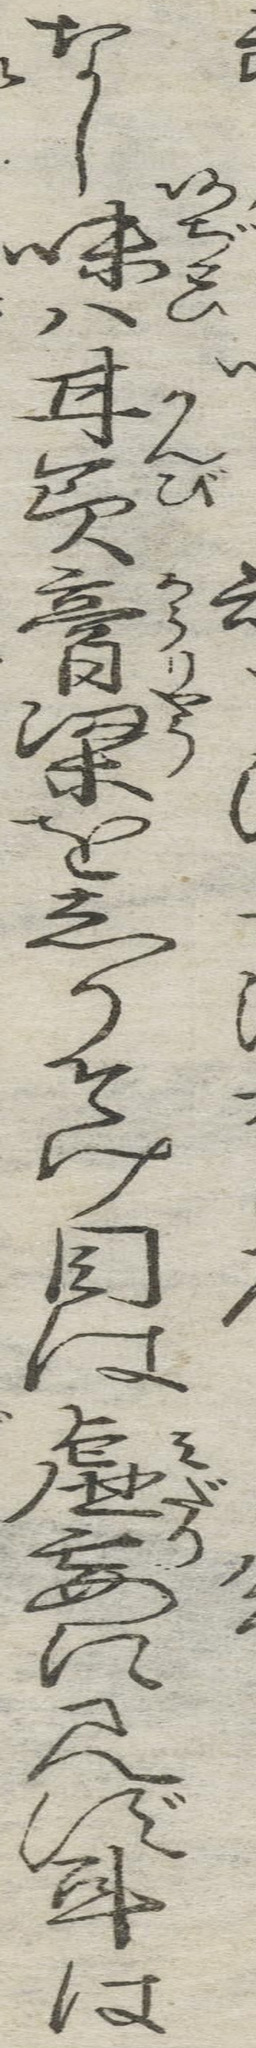なし味は甘美膏梁をしりそけ目は虚妄に見ず耳は
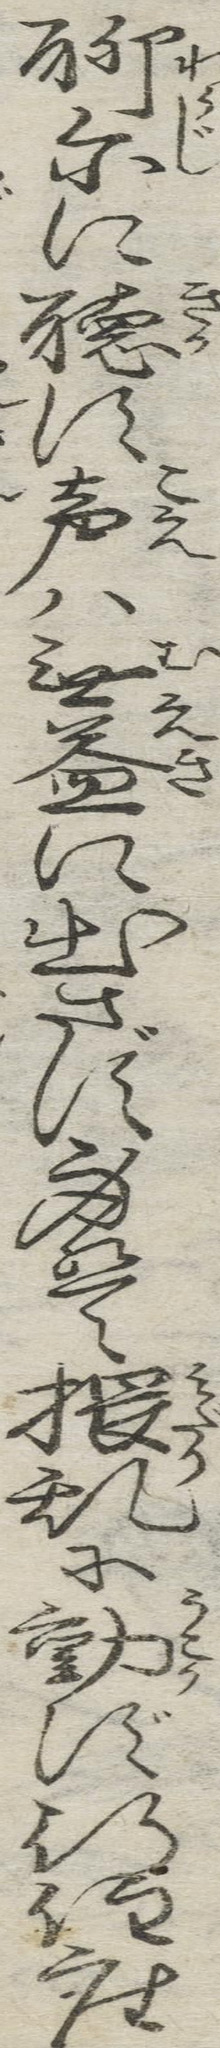聊爾に聴す声は無益に出さず身以て攘乱に動ず行住座
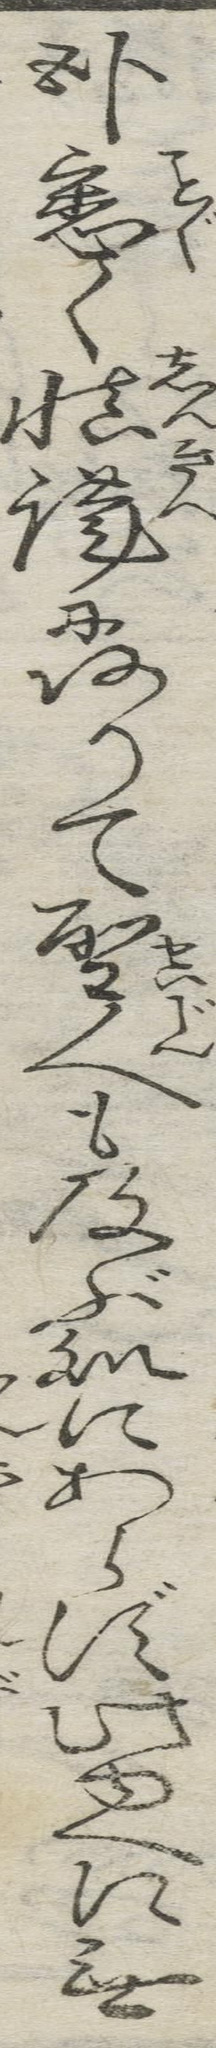臥悉く慎謹にありて聖人も及ぶ処にあらず此ゆへに無
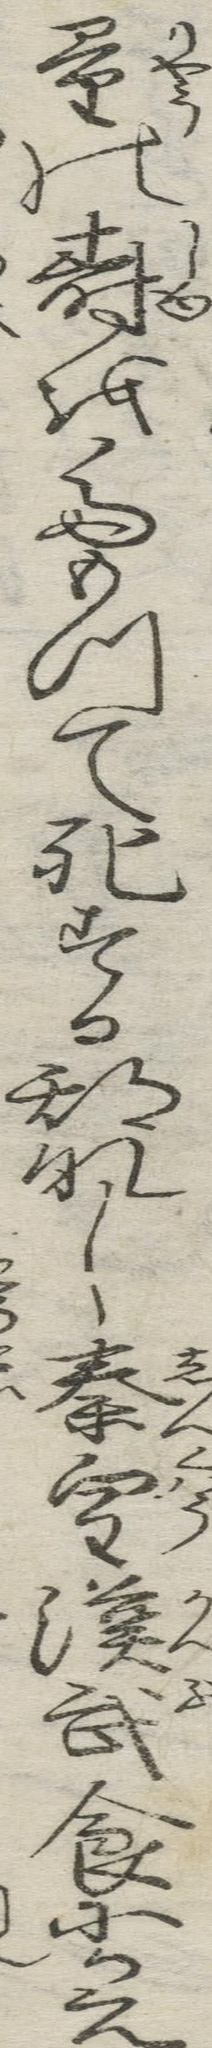量の寿をたもつて死する期なし秦皇漢武食にかえ
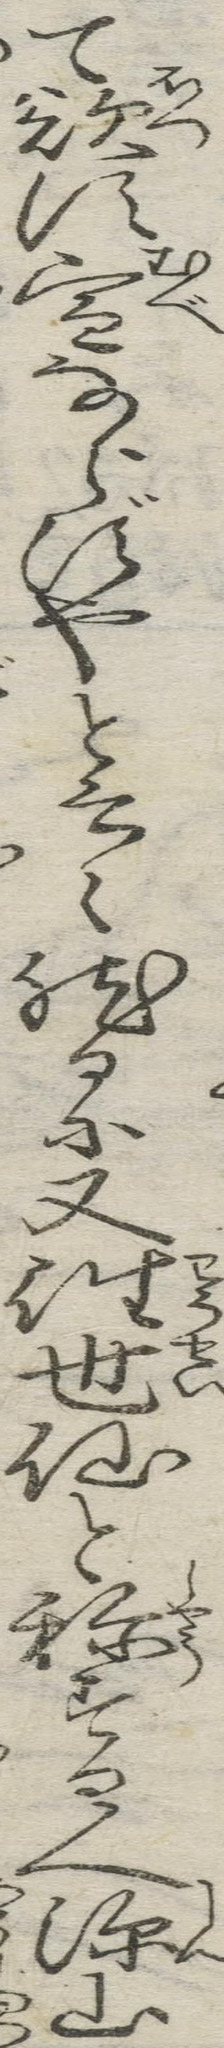て欲す宜ならずやと云々然るに又往世仙と称する人深山
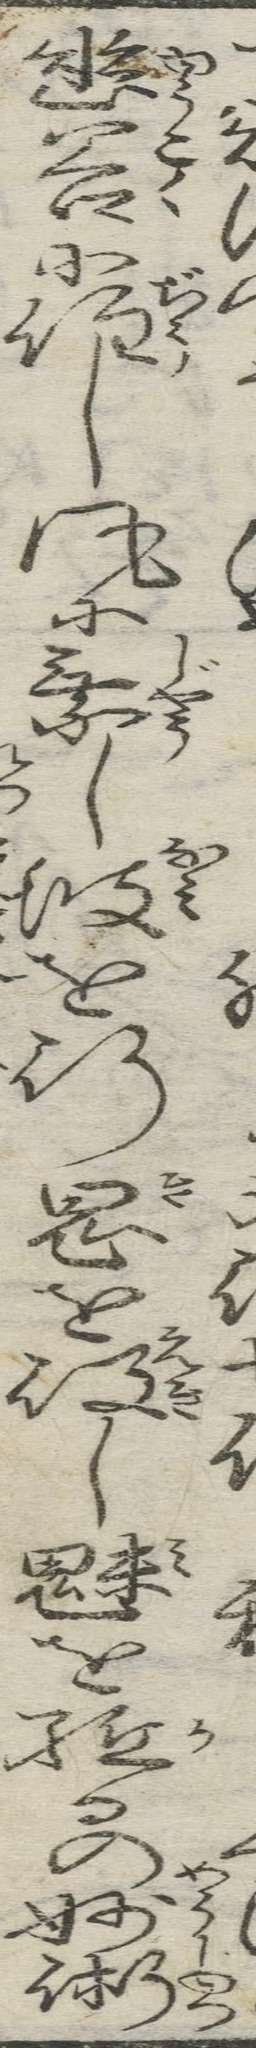幽谷に住し風に乗し波を行鬼を役し魅を駆るの妙術
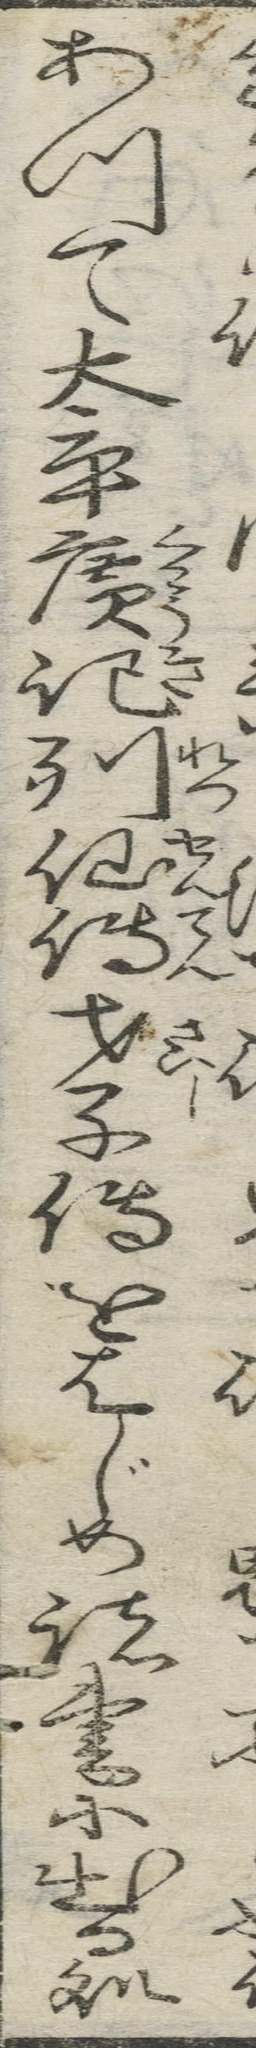あつて太平広記列仙伝才子伝をはじめ諸書に出る処
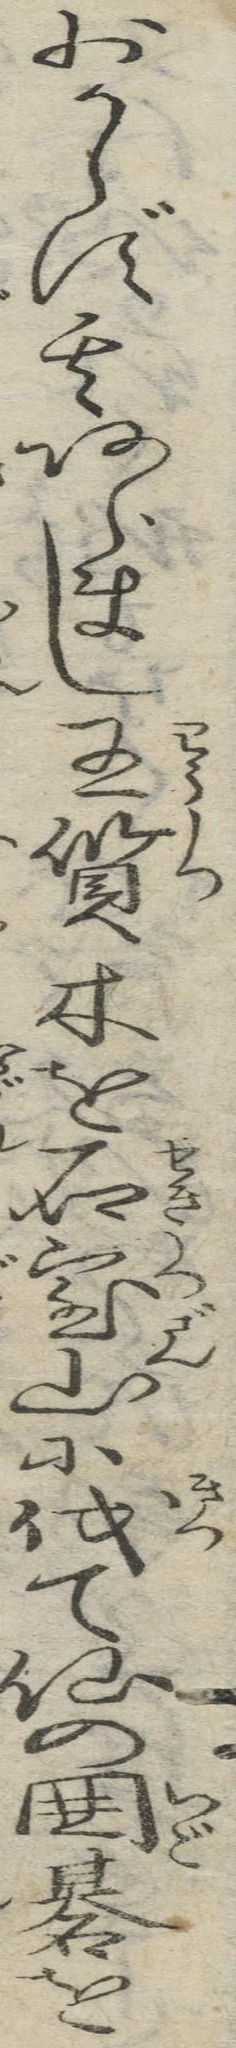少からず其あらまし王質木を石室山に伐て仙の囲碁を
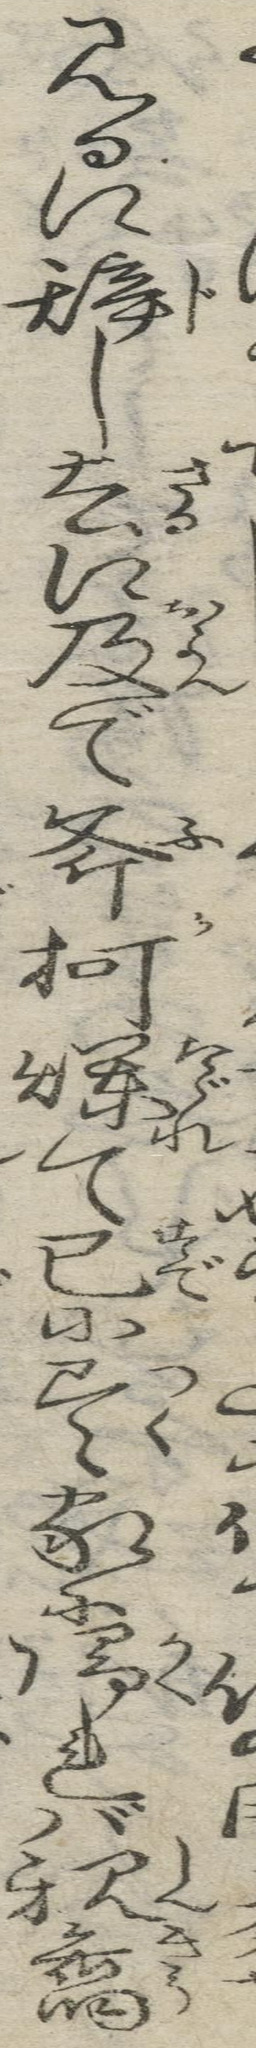見るに辞し去に及で斧柯爛て巳に尽家に帰れば親旧
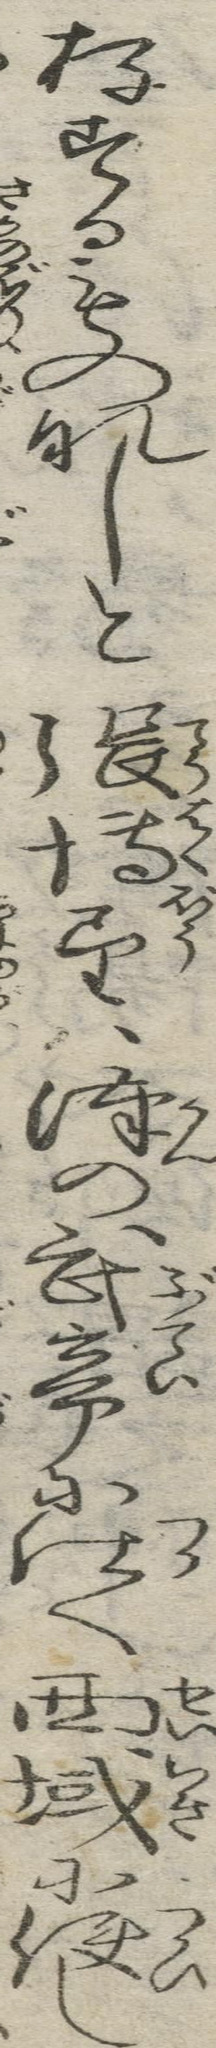存するものなしと張博望は漢の武帝に仕へ西域に使し
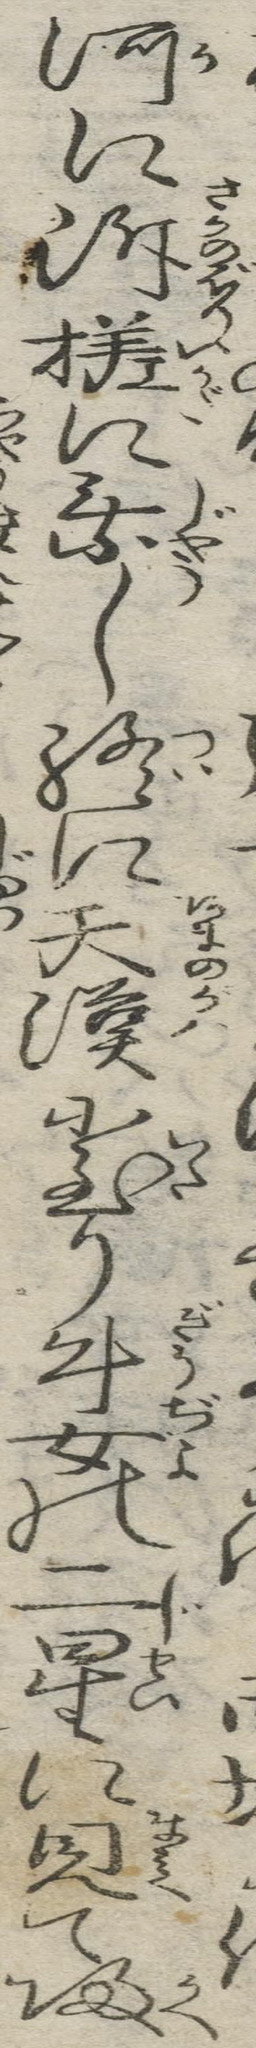河に溯槎に乗し終に天漢に至り牛女の二星に見て帰
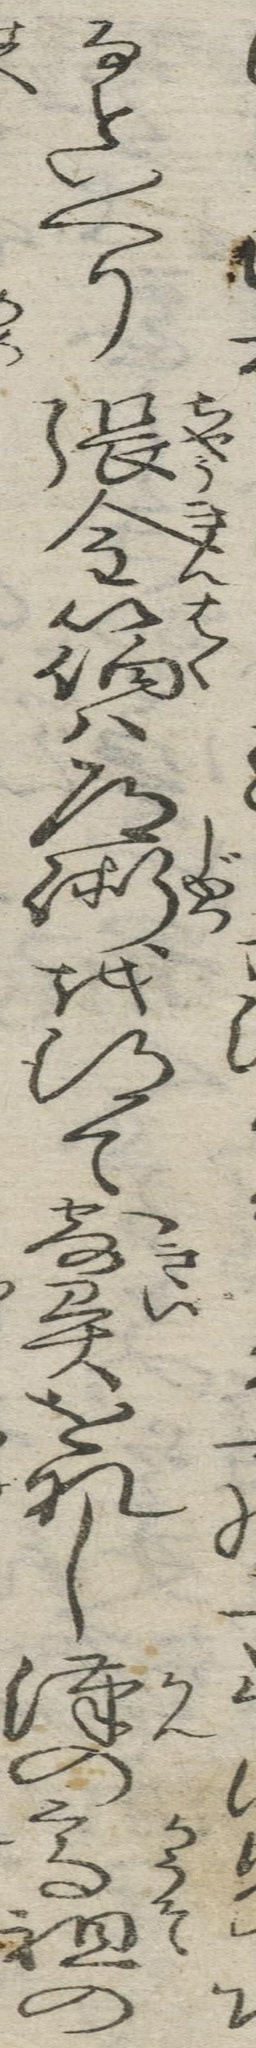るといへり張金箔は道術を以て奇異をなし漢の高祖の
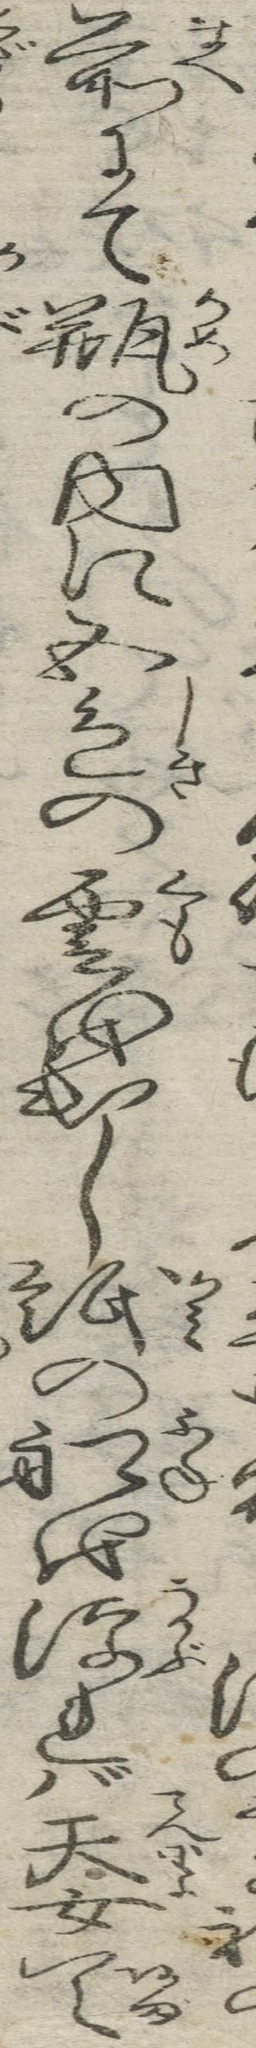前にて瓶の内に五色の雲を出し紙の船を浮れば天女天
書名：訓蒙天地辨　人
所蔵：東京大学地震研究所図書室 Earthquake Research Institute Library, The University of Tokyo, JAPAN
